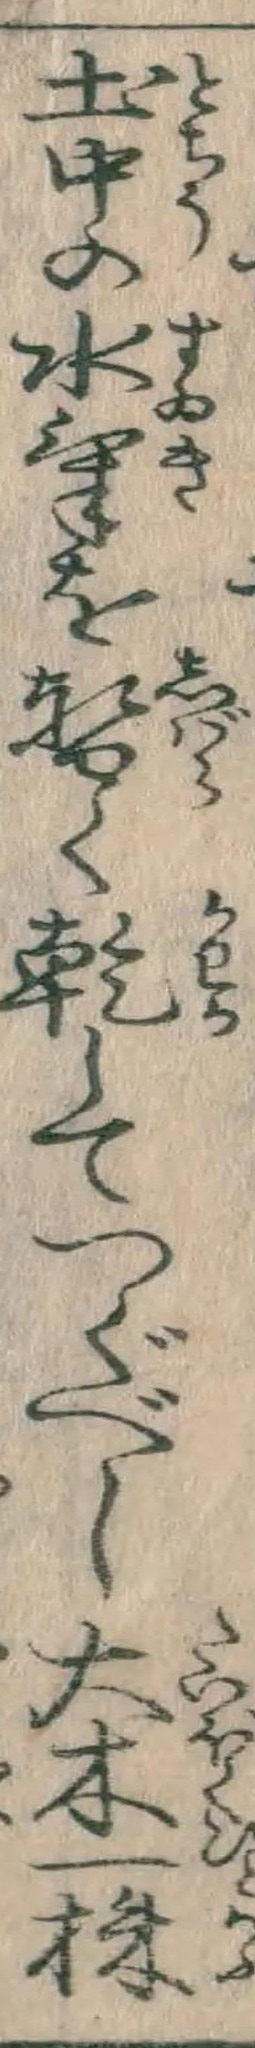土中の水気を暫く乾してつぐべし大木一株
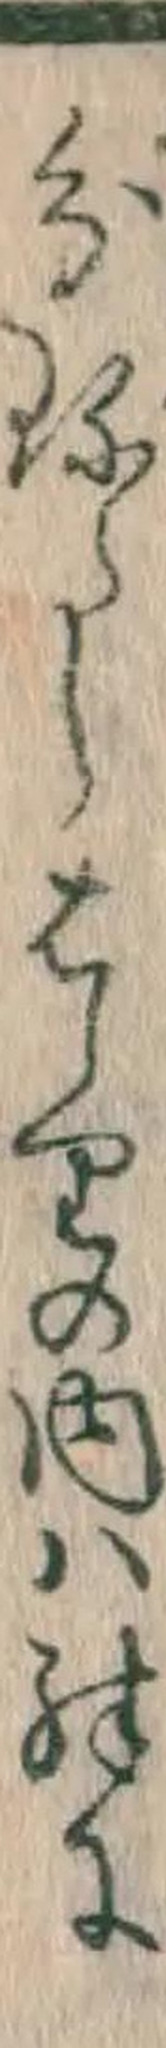分珍らしはしりの内は殊に
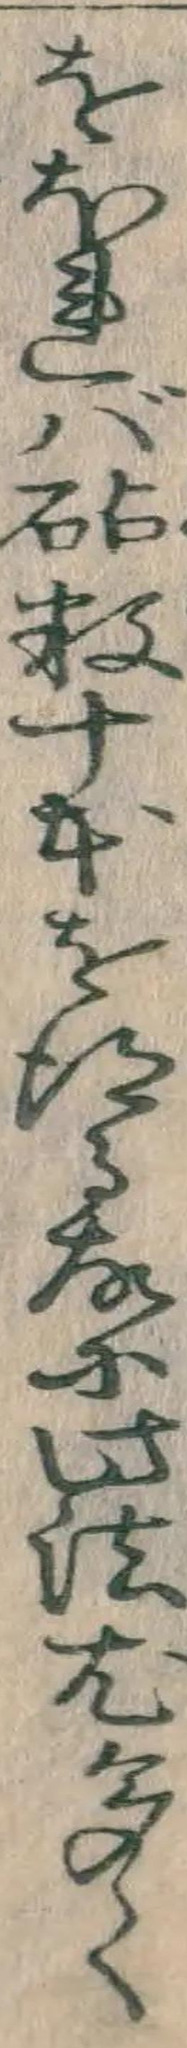をほれば砧数十本を得る故に此法尤多く
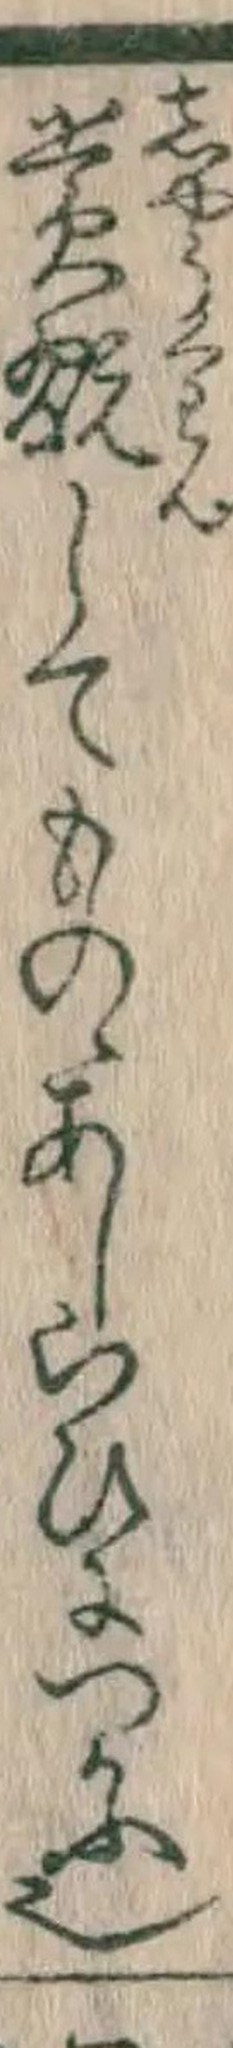賞翫してものゝあしらひにつかふ也
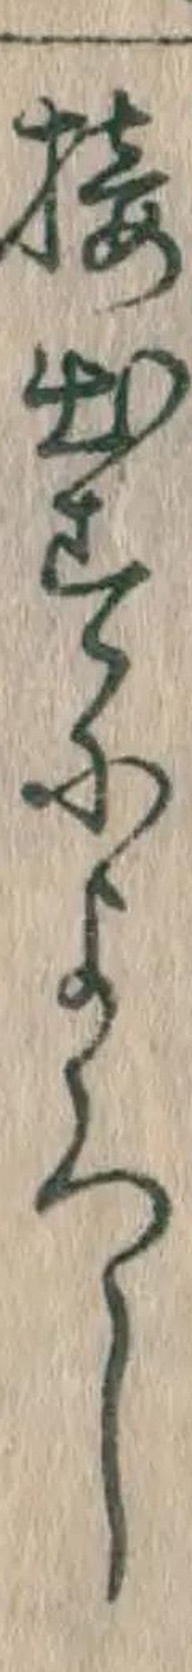接出すによろし
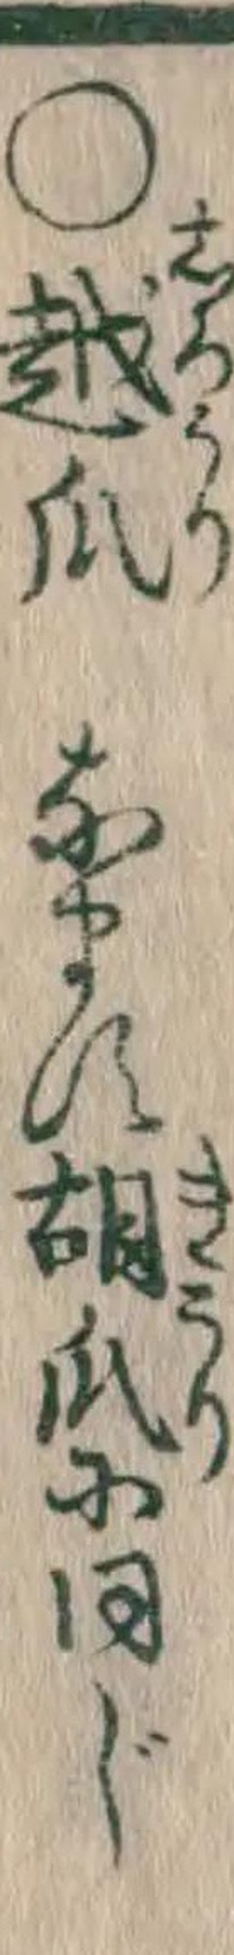○越瓜なます胡瓜に同じ
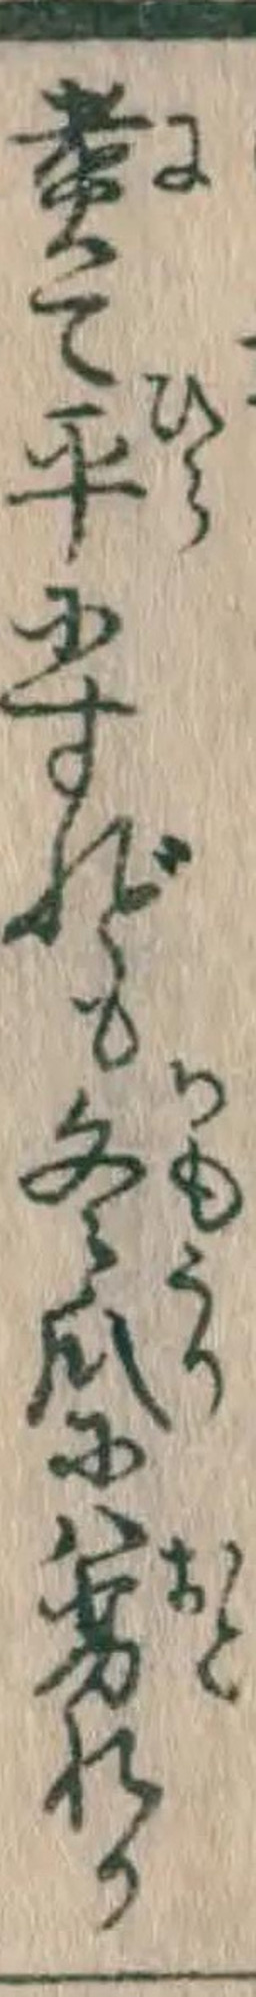煮て平にすれども冬瓜には劣れり
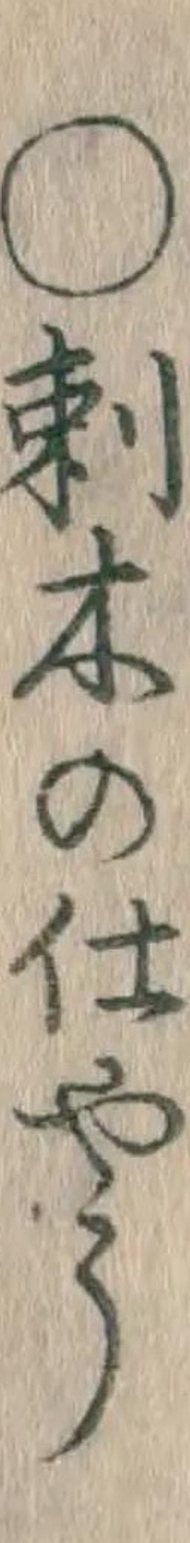○剌木の仕やう
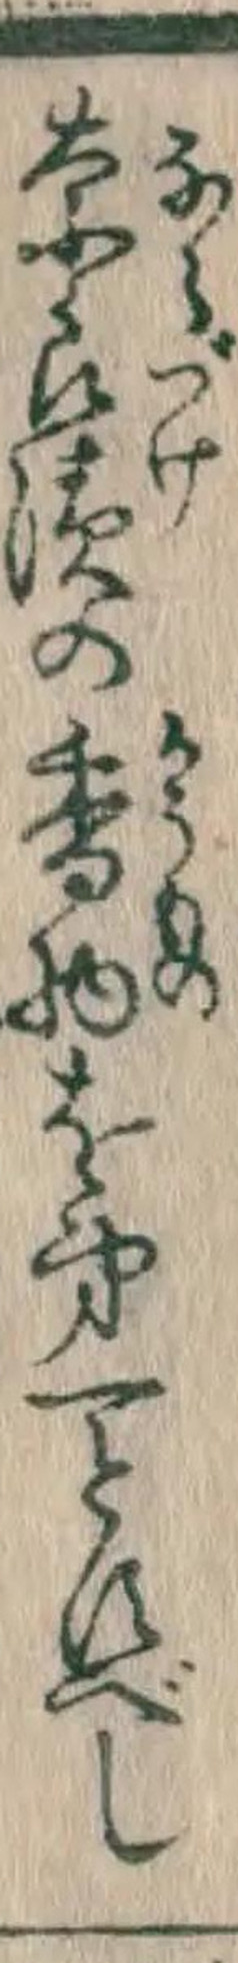奈良漬の香物を第一とすべし
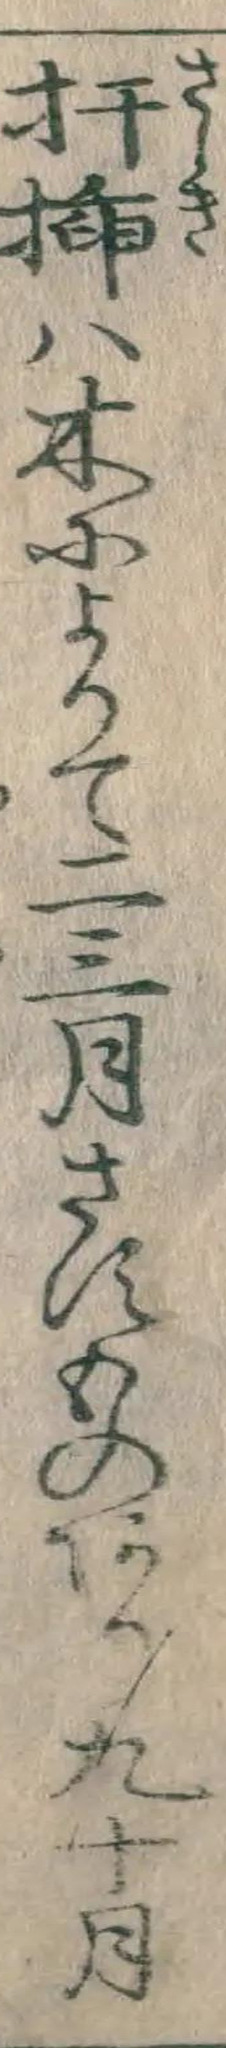扦挿は木によりて二三月さすものあり九十月
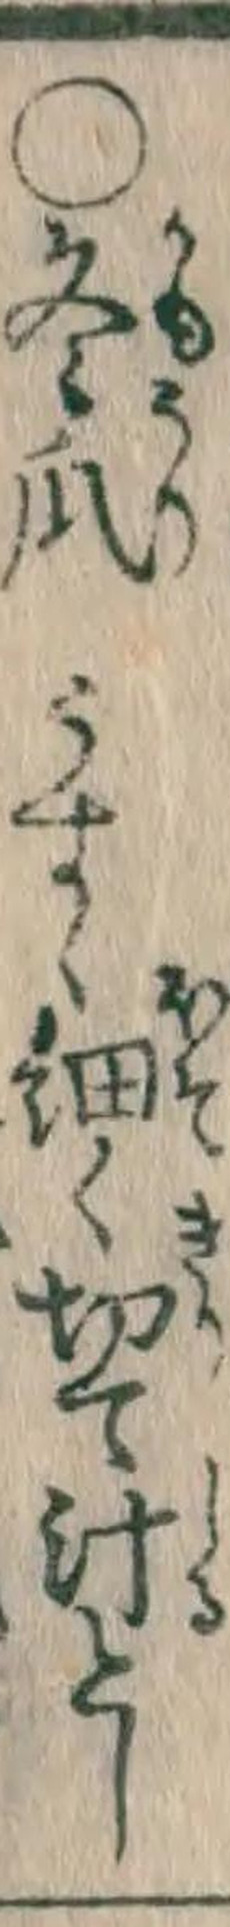○冬瓜うすく細く切て汁とし
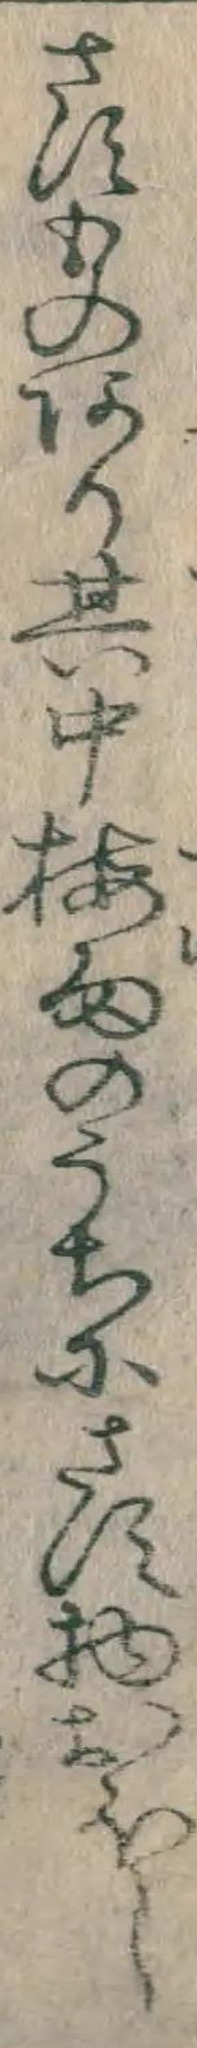さすものあり其中梅雨のうちにさす物おほし
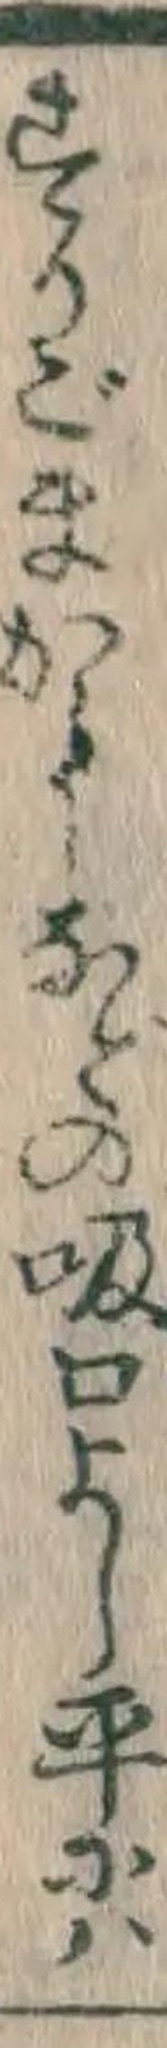すりごまからしなどの吸口よし平には
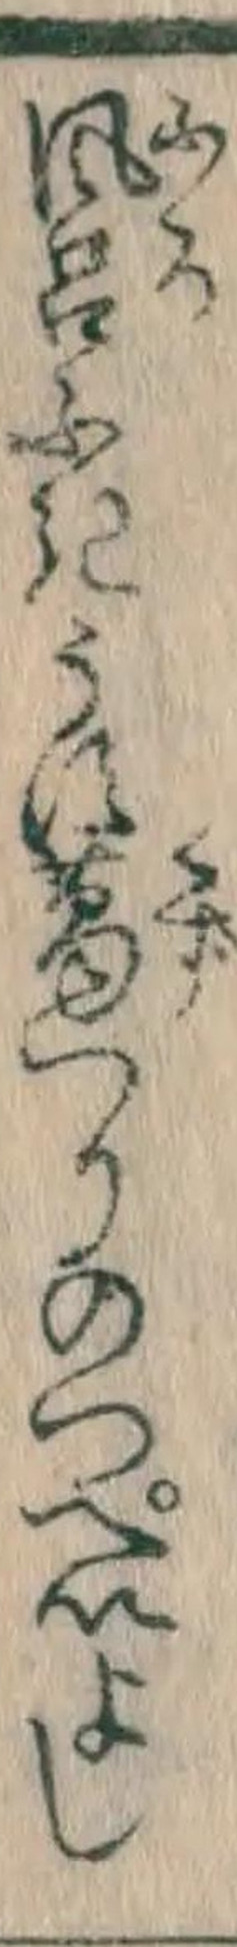風呂ふきうす葛いりのつぺいよし
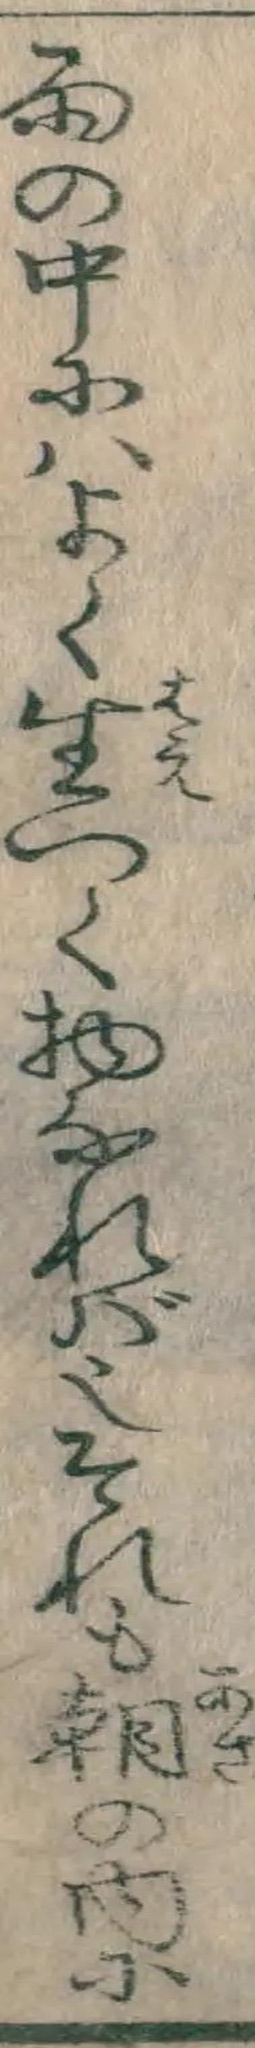雨の中にはよく生つく物なれば也それも朝の内に

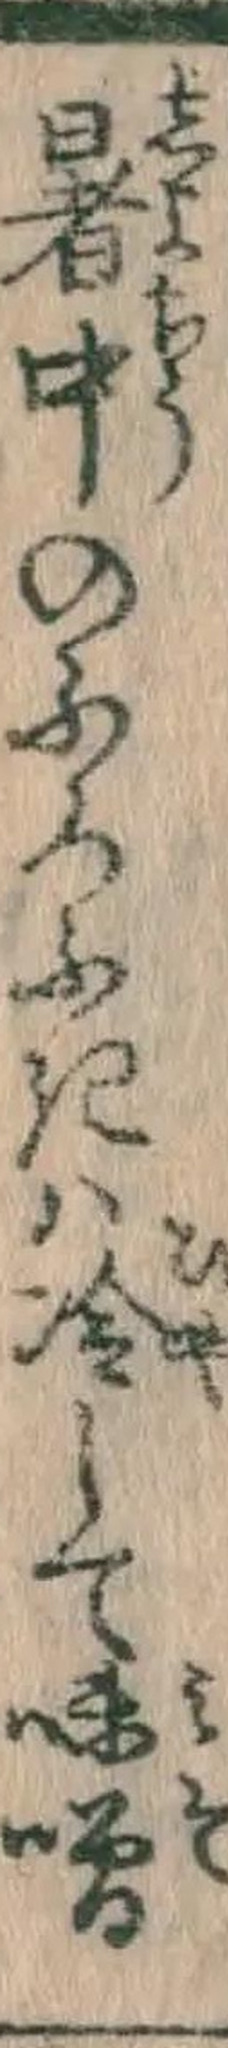暑中のふろふきは冷して味噌
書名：広益秘事大全 3巻. [5]
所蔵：国立国会図書館 National Diet Library, JAPAN
